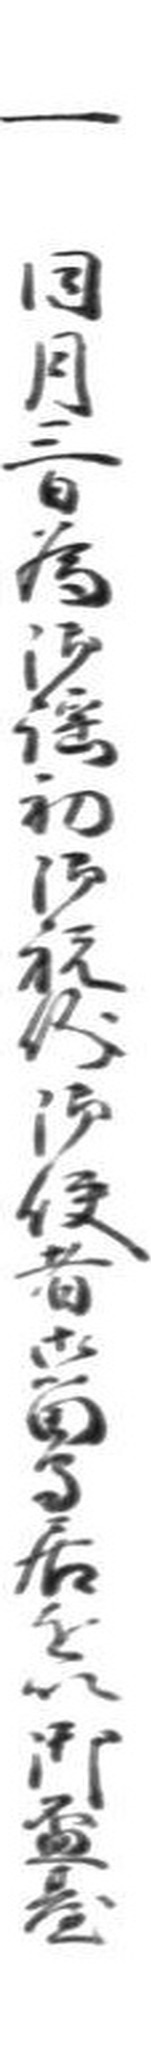一同月三日為御謡初御祝儀御使者御留守居を以御盃台
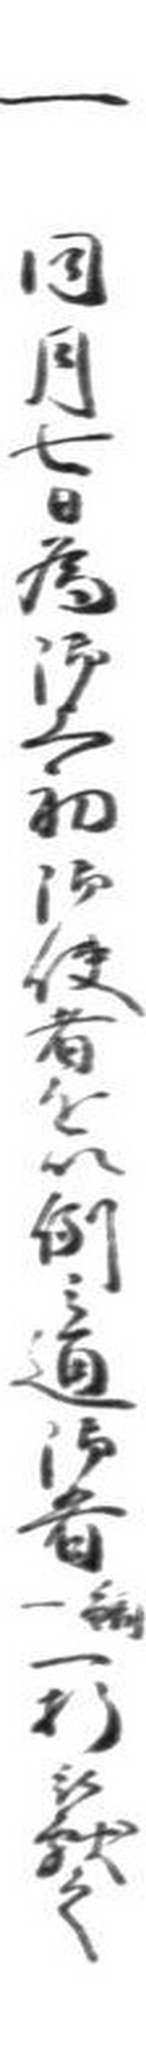一同月七日為御上初御使者を以例之通御肴鯛一一折被献之
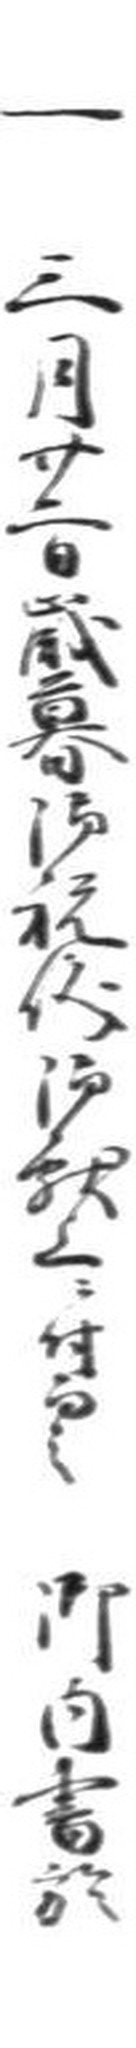一三月廿二日歳暮御祝儀御献上ニ付而之御内書於

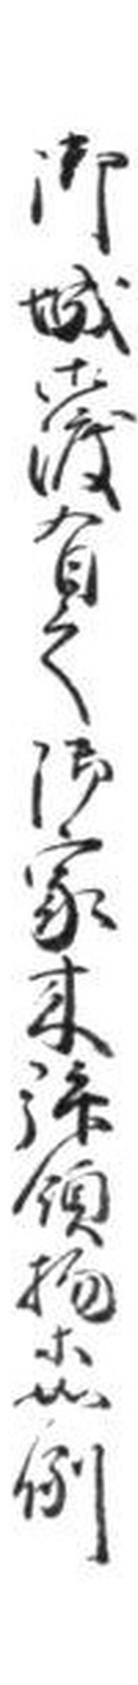御城御渡有之御家来拝領物等如例
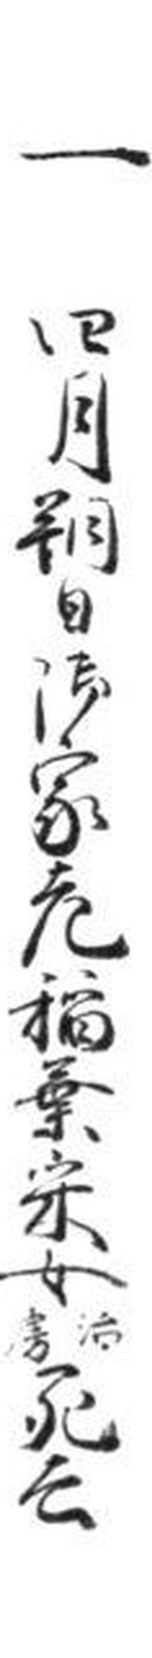一四月朔日御家老稲葉采女治房死去
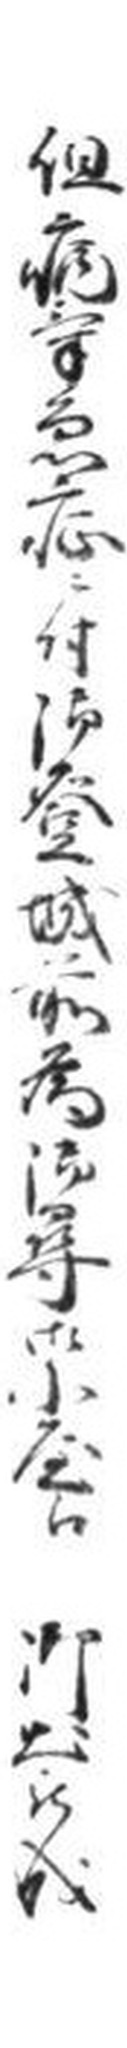但病気急症ニ付御登城前為御尋御小屋江御出被成
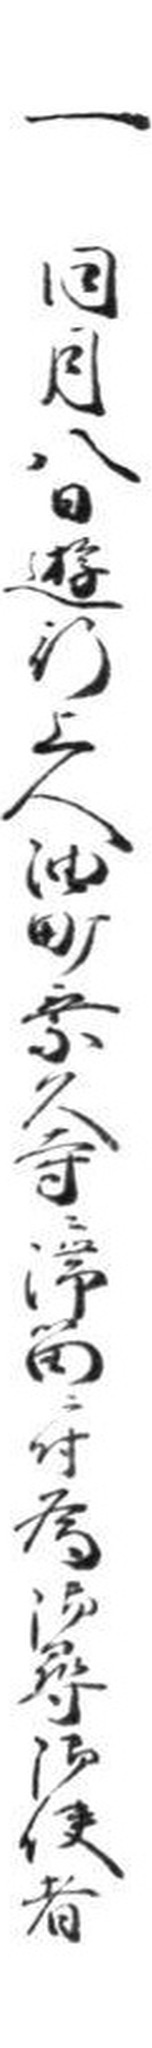一同月八日遊行上人油町乗久寺ニ滞留ニ付為御尋御使者
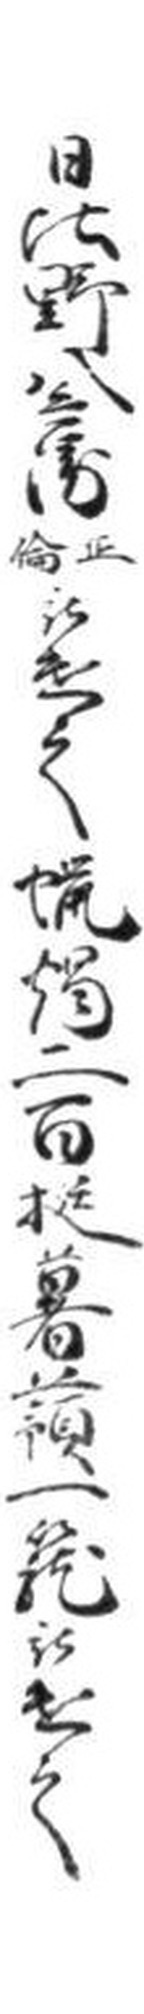日比野八兵衛正倫被遣之蝋燭二百挺薯蕷一籠被遣之
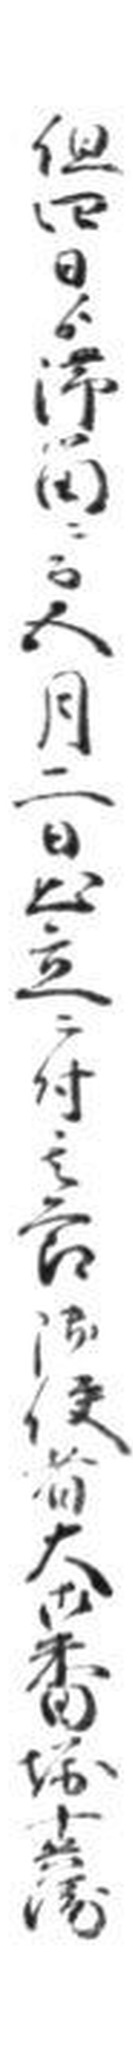但四日ゟ滞留ニ而五月二日出立ニ付其節御使者大御番堀十兵衛
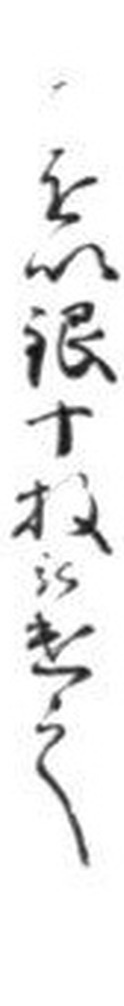を以銀十枚被遣之
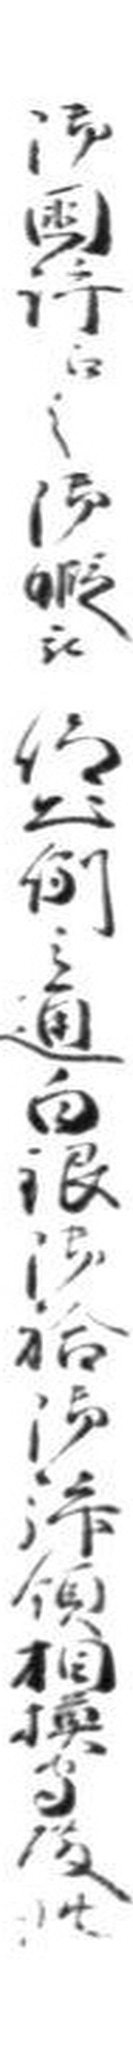御国許江之御暇被仰出例之通白銀御袷御拝領相模守殿此
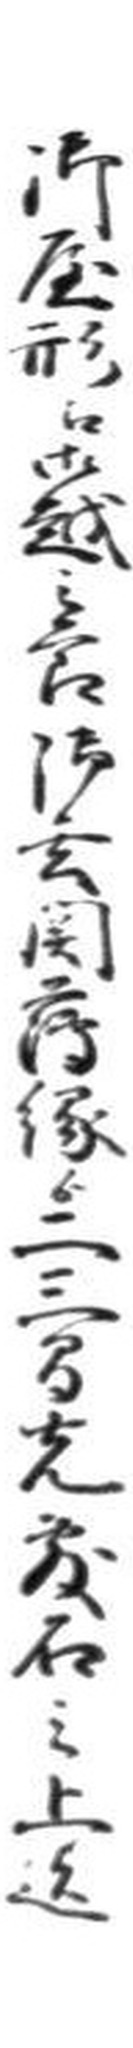御屋形江御越之節御玄関薄縁ゟ二三間先敷石之上迄
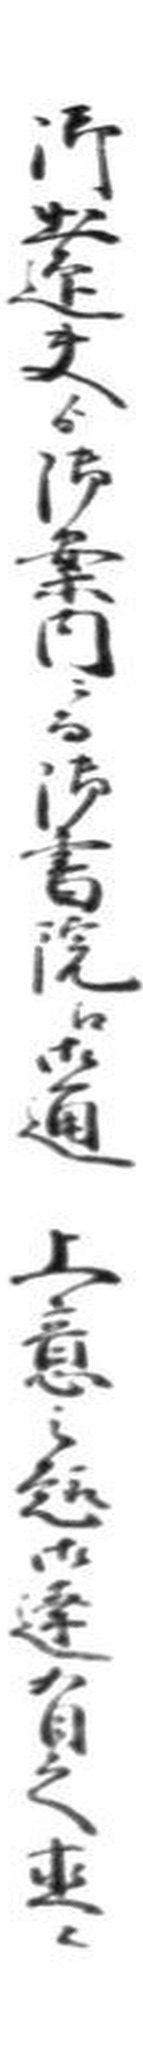御出迎夫ゟ御案内ニ而御書院江御通上意之趣御達有之直ニ
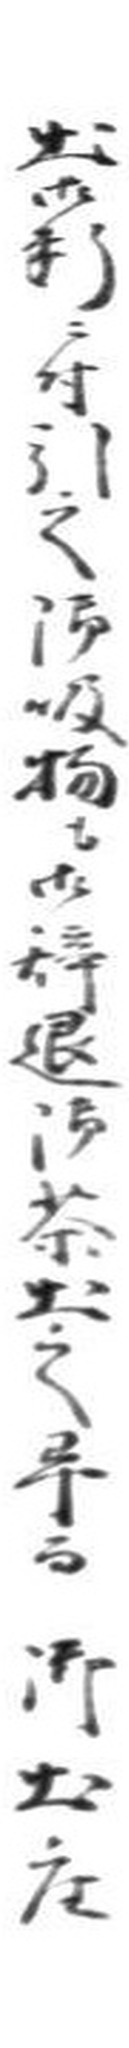出御断ニ付引之御吸物も御辞退御茶出之畢而御出座
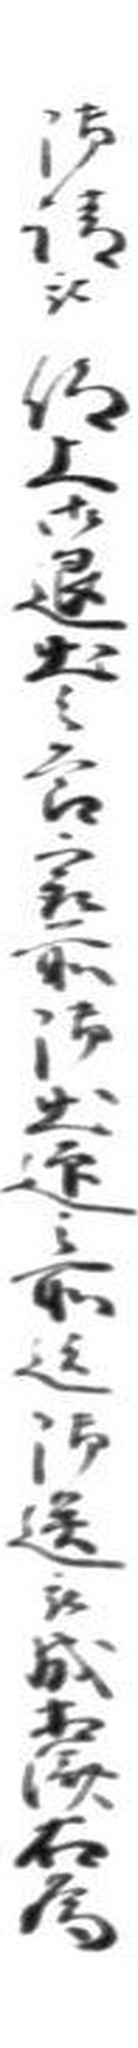御請被仰上御退出之節最前御出迎之所迄御送被成相済右為
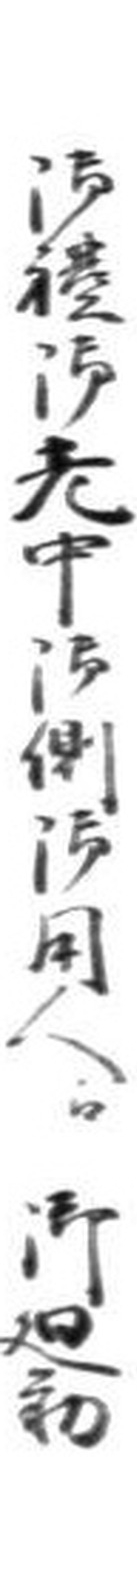御礼御老中御側御用人江御廻勤
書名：家譜 十七 吉品公 従元禄元年到同二年
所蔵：福井県文書館 Fukui Prefectural Archives
